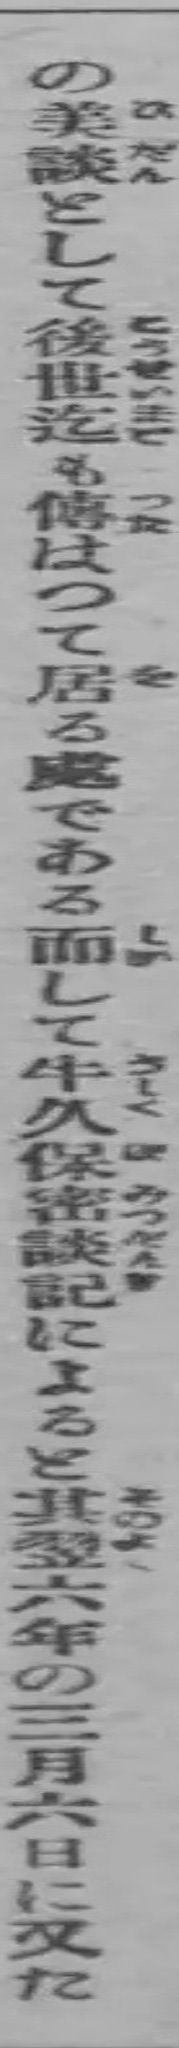の美談として後世迄も伝はつて居る処である而して牛久保密談記によると其翌六年の三月六日に又た
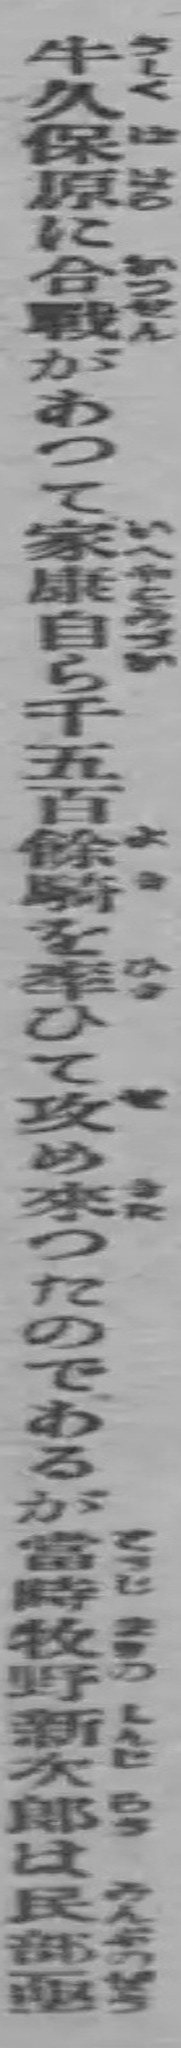牛久保原に合戦があつて家康自ら千五百余騎を率ひて攻め来つたのであるが当時牧野新次郎は民部丞
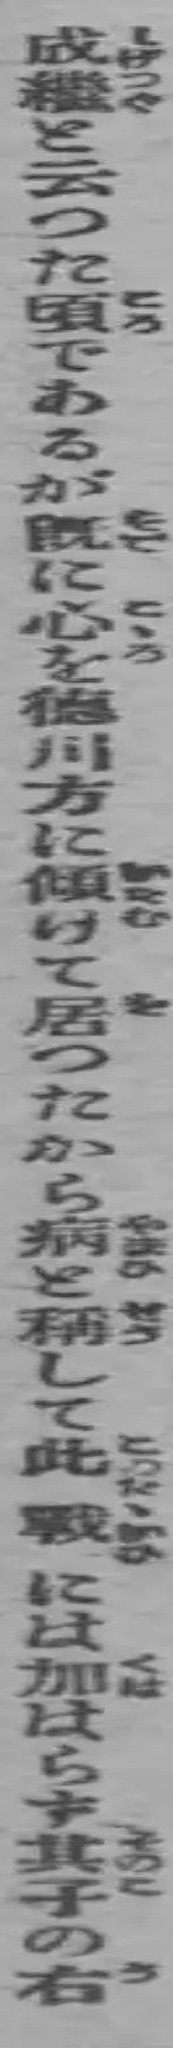成継と云つた頃であるが既に心を徳川方に傾けて居つたから病と称して此戦には加はらず其子の右

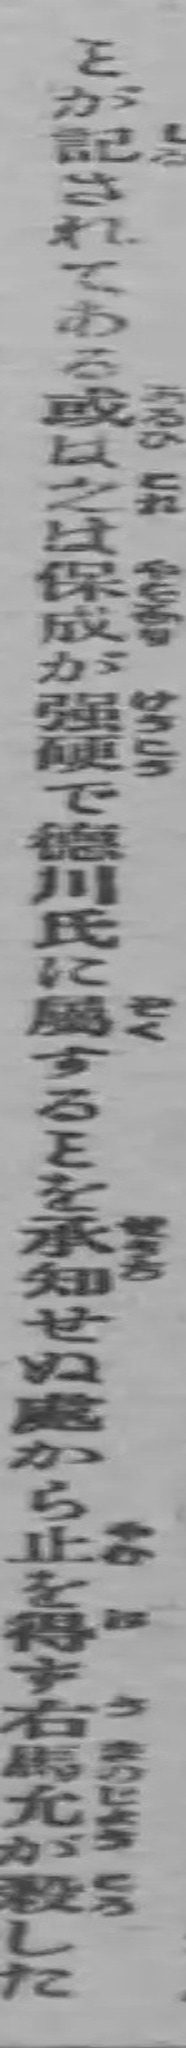ことが記されてある或は之は保成が強硬で徳川氏に属することを承知せぬ処から止を得ず右馬允が殺した
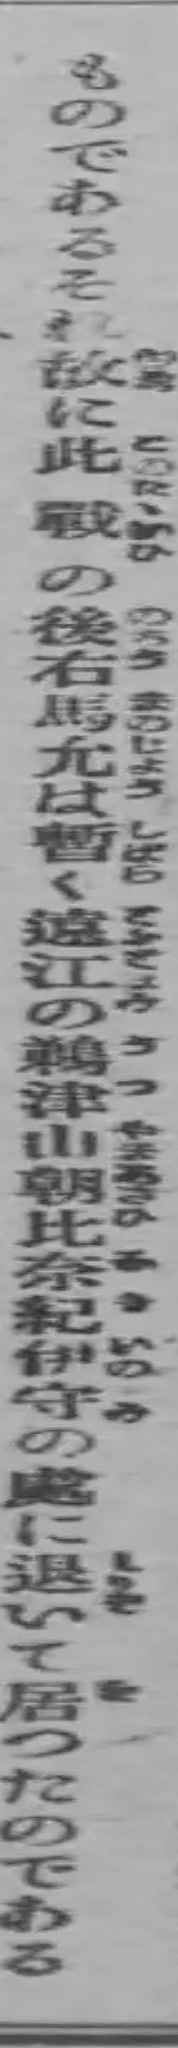ものであるそれ故に此戦の後右馬允は暫く遠江の鵜津山朝比奈紀伊守の処に退いて居つたのである
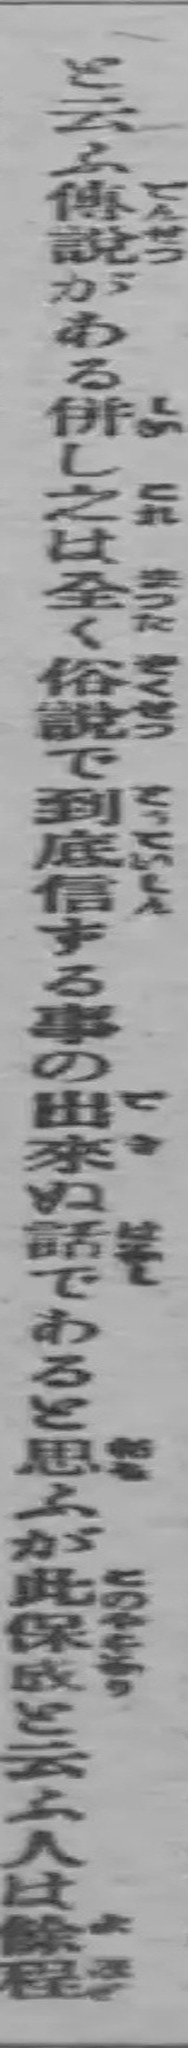と云ふ伝説がある併し之は全く俗説で到底信ずる事の出来ぬ話であると思ふが此保成と云ふ人は余程
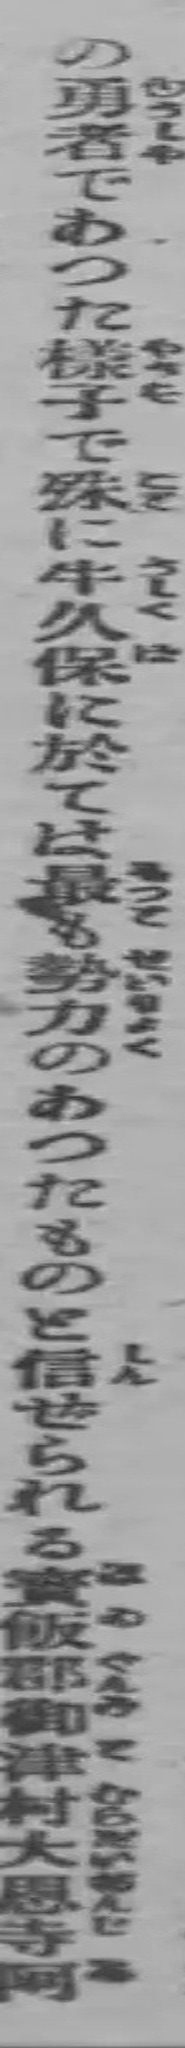の勇者であつた様子で殊に牛久保に於ては最も勢力のあつたものと信ぜられる宝飯郡御津村大恩寺阿
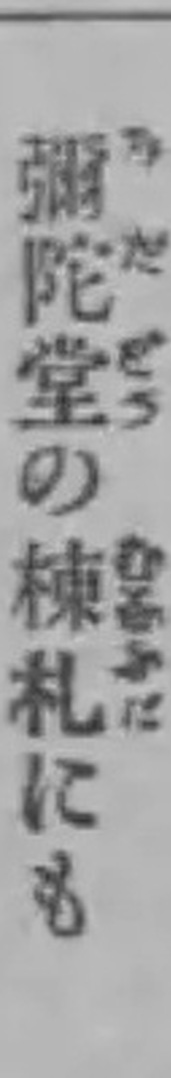弥陀堂の棟札にも
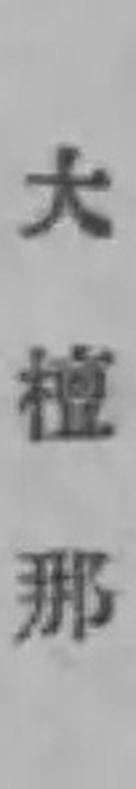大檀那
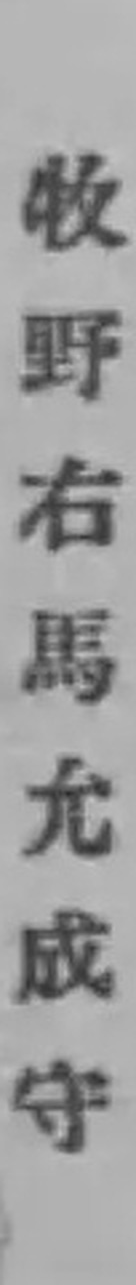牧野右馬允成守
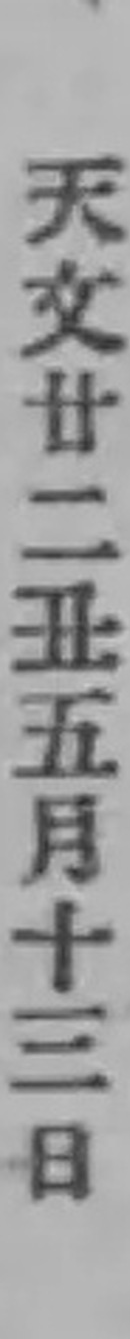天文廿二丑年五月十三日
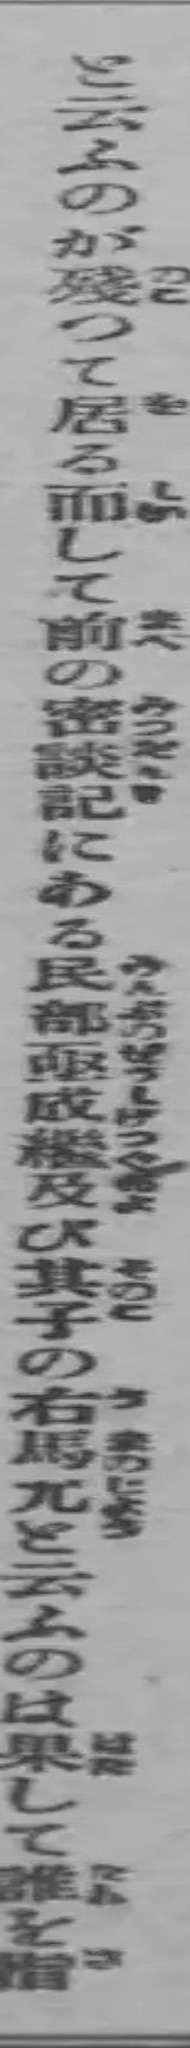と云ふのが残つて居る而して前の密談記にある民部丞成継及び其子の右馬允と云ふのは果して誰を指
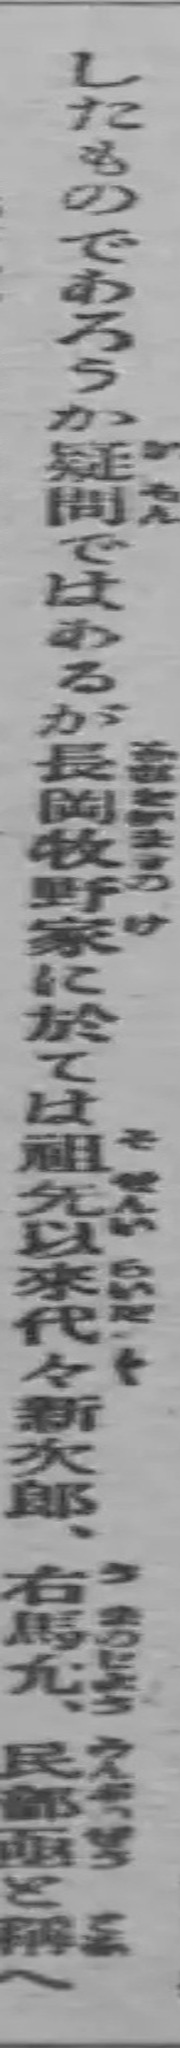したものであろうか疑問ではあるが長岡牧野家に於ては祖先以来代々新次郎、右馬允、民部丞と称へ
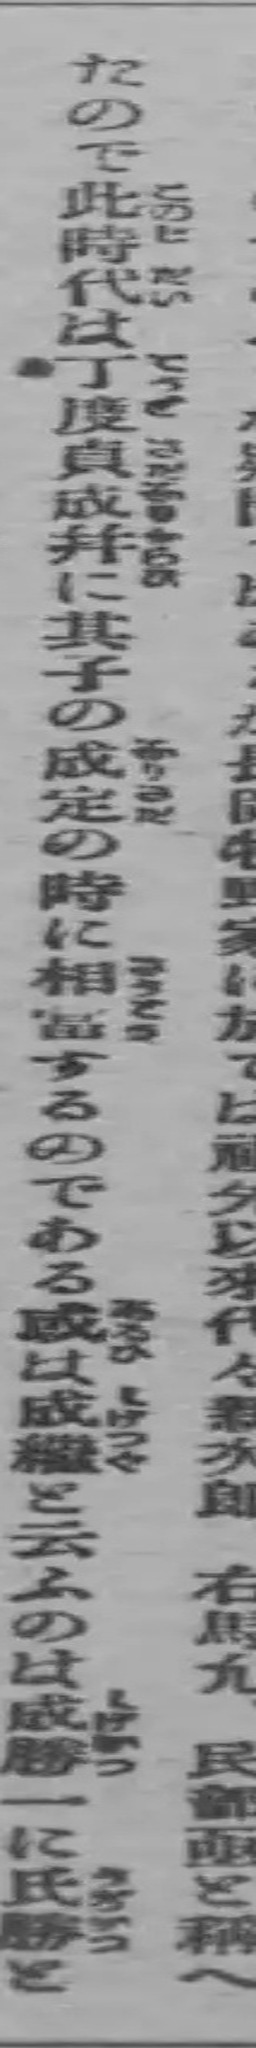たので此時代は丁度貞成幷に其子の成定の時に相当するのである或は成継と云ふのは成勝一に氏勝と
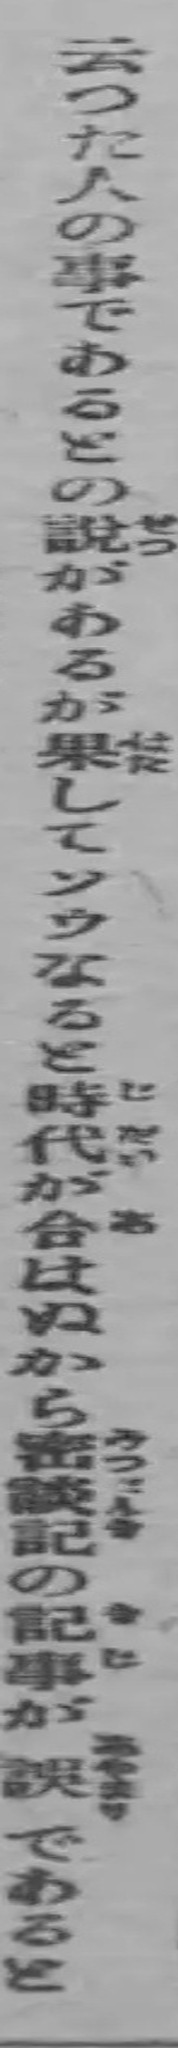云つた人の事であるとの説があるが果してソウなると時代が合はぬから密談記の記事が誤であると
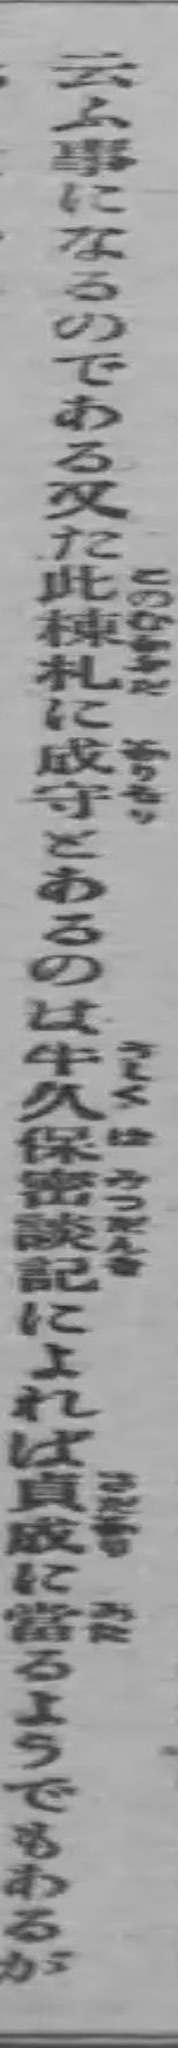云ふ事になるのである又た此棟札に成守とあるのは牛久保密談記によれば貞成に当るようでもあるが
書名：豊橋市史談
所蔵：国立国会図書館 National Diet Library, JAPAN
